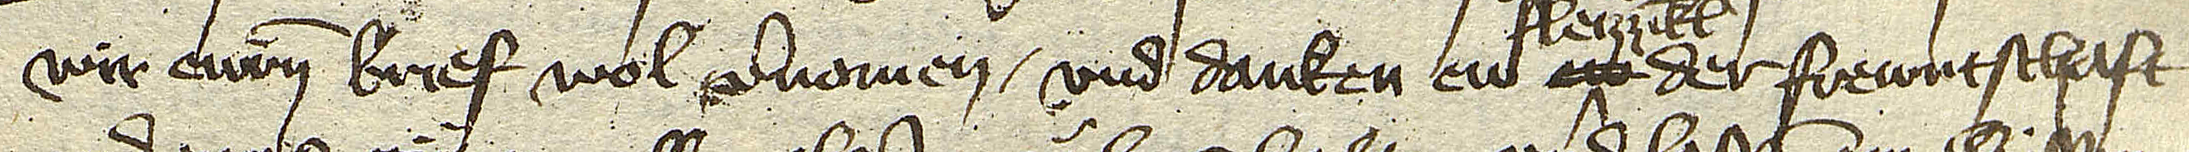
wir ewrn* brief wol v*nomen / vnd danken ew ew der frewntſchaft
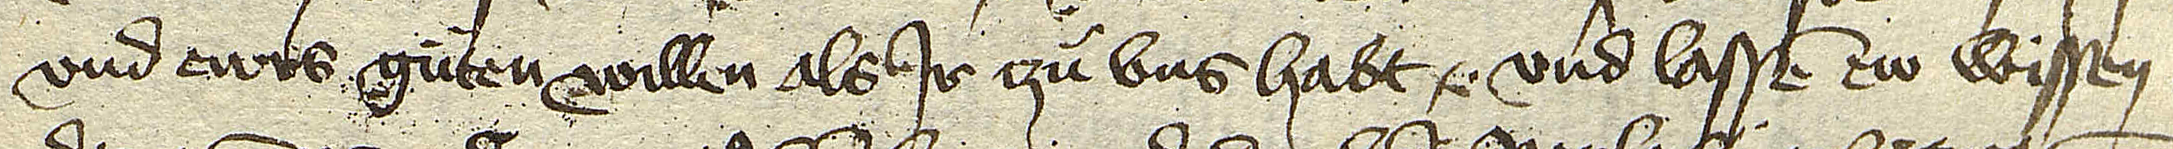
vnd ewrs güten willen als Ir cʒü vns habt / . vnd laſſe* ew wiſſen /
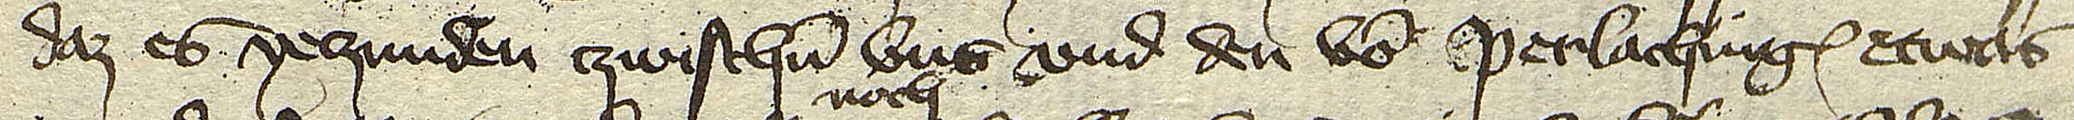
daʒ es yecʒunden cʒwiſchn* vns vnd den vo* Perlaching* etwas
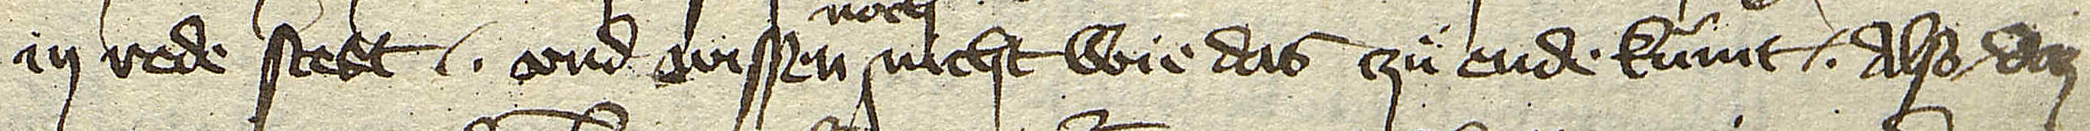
in rede ſteet / . vnd wiſſen nicht wie das cʒü ende kumt / . Alſo / daʒ
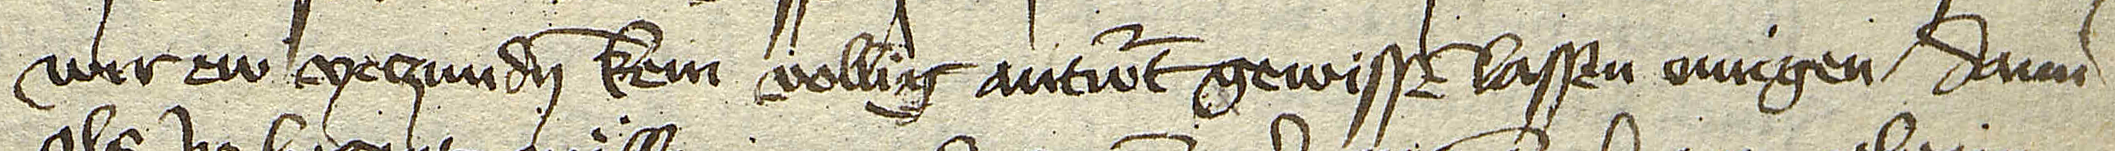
wir ew yecʒundn* kein vollig antw*t gewiſſe* laſſen mügen / dann
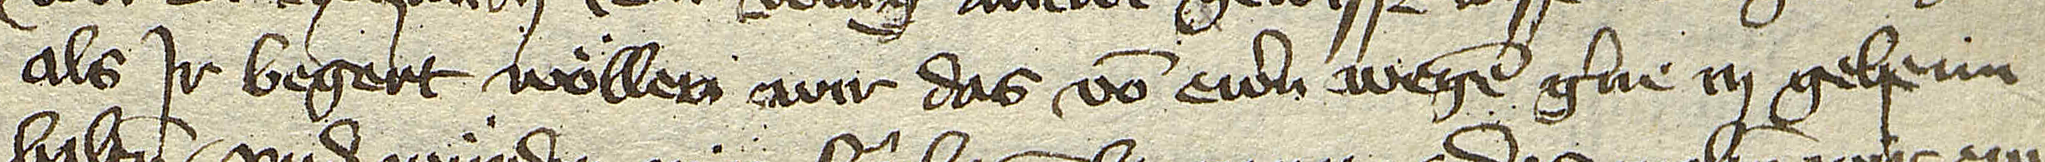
als Ir begert wöllen wir das vo* ew*n wege* g*ne in geheim
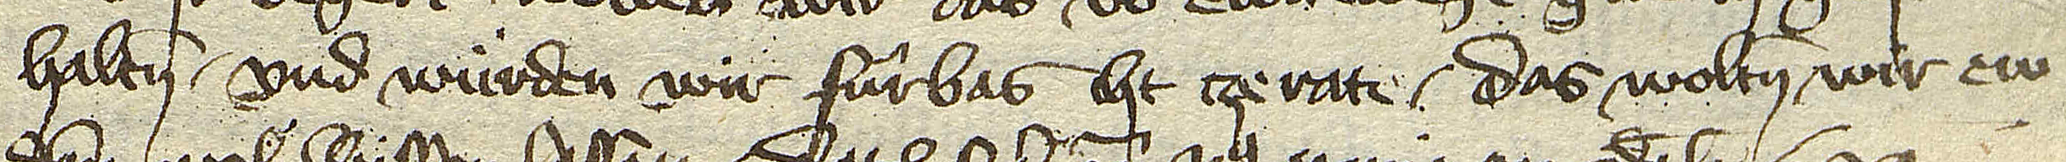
haltn* / vnd würden wir fürbas iht cʒe rate / Das woltn* wir ew
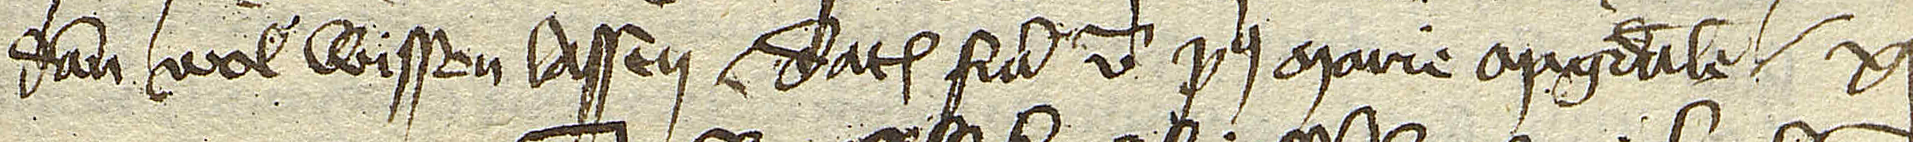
dan* wol wiſſen laſſen / Dat* fia* v* p* Marie Magdale* / xi
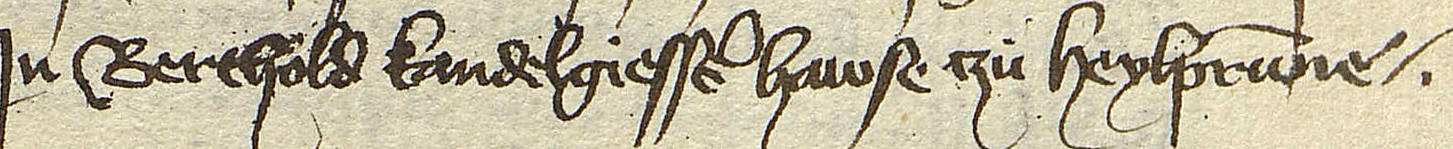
In Berthold kandelgieſſs* hawſe cʒü heylprune* / .
